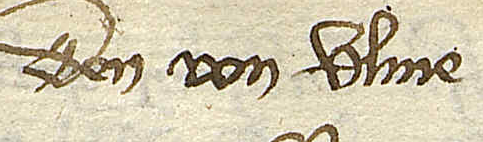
Den von Vmle
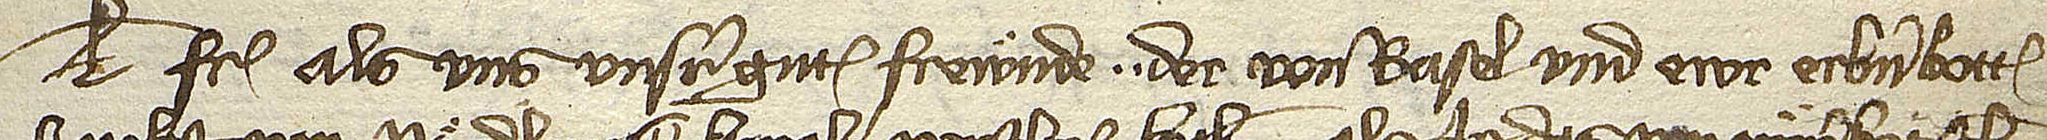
L* fr* als vns vnſr* gut* freẅnde ~ der von Baſel vnd ewr erbn* bott*
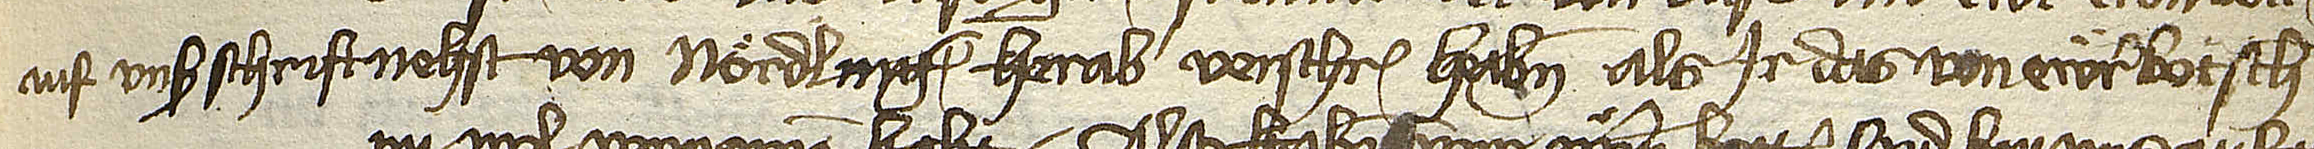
auf vnſ* ſchrift nehſt von Nördling* herab verſchr* habn* als Ir das von eẅr* botſch*
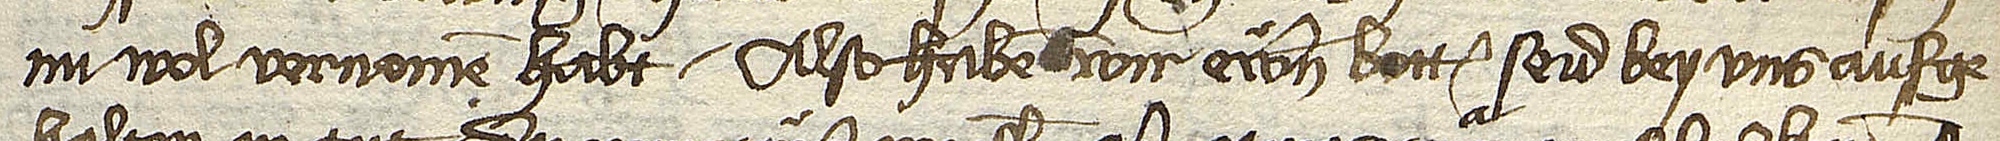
nu wol vernome* habt / Alſo habe* wir eẅn* bott* ſeid bey vns aufge
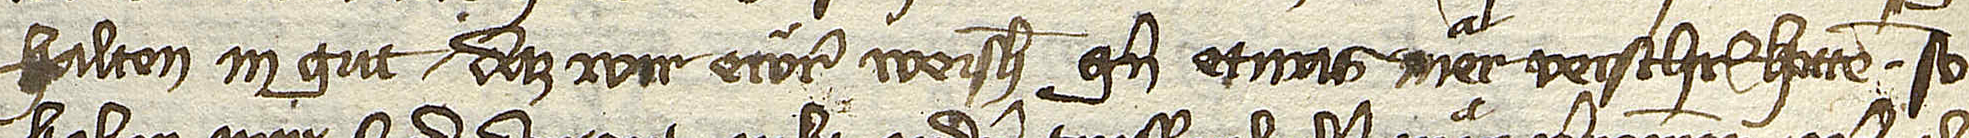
halten in gut / daʒ wir eẅr* weiſh* gn* etwas mër verſchr* hette* . ſo
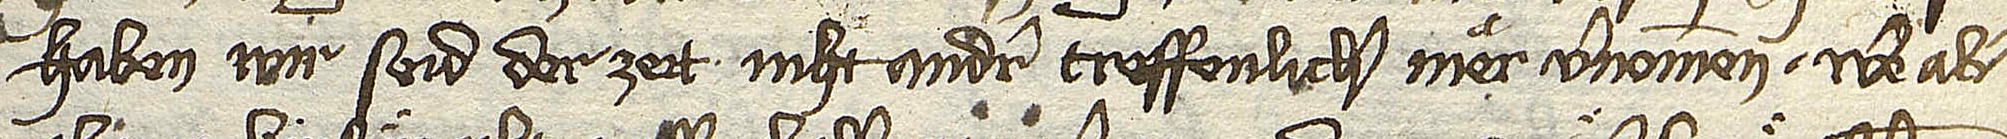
haben wir ſeid der ʒeit niht andr* treffenlich* mër v*nomen / w*e ab*
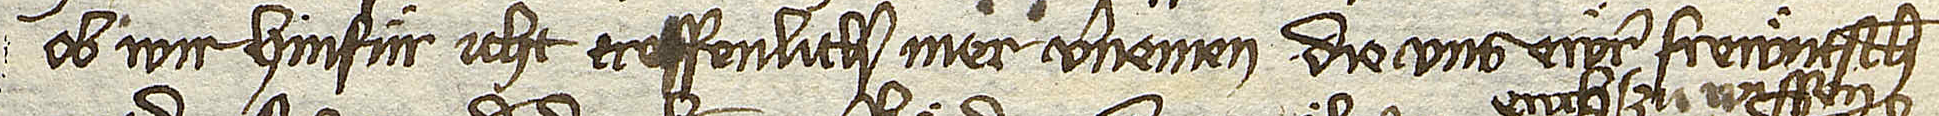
ob wir hinfür icht treffenlich* mer v*nemen . die vns eẅr* freẅntſch*
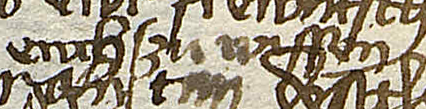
ewch ʒu wiſſen
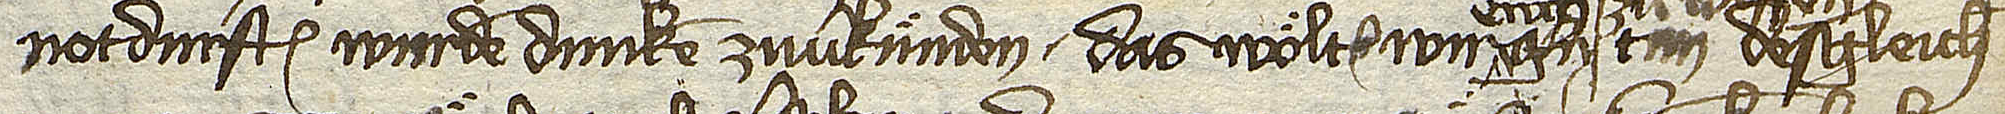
notdurft* wurde* dunke* ʒuu*künden / das wölt* wir gn* tun deſgleich*
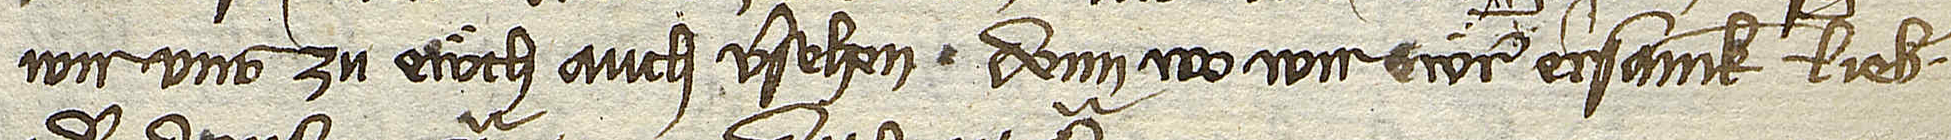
wir vns ʒu eẅch auch v*ſehen . Denn wo wir eẅr* erſamk* lieb
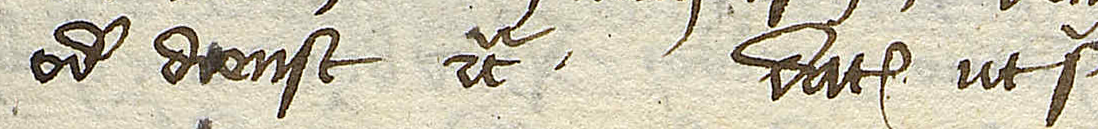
od* dienſt ec* Dat* ut ſ*.
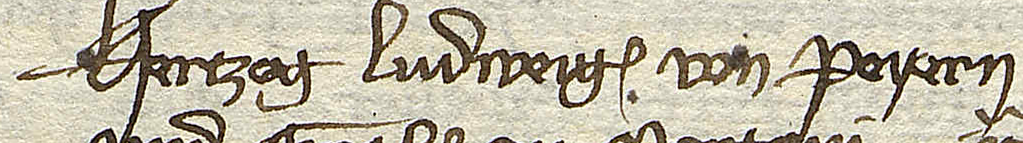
Hercʒog Ludweig* von Peyern
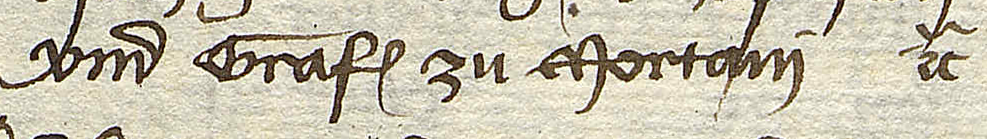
vnd Graf* cʒu Mortani ec*
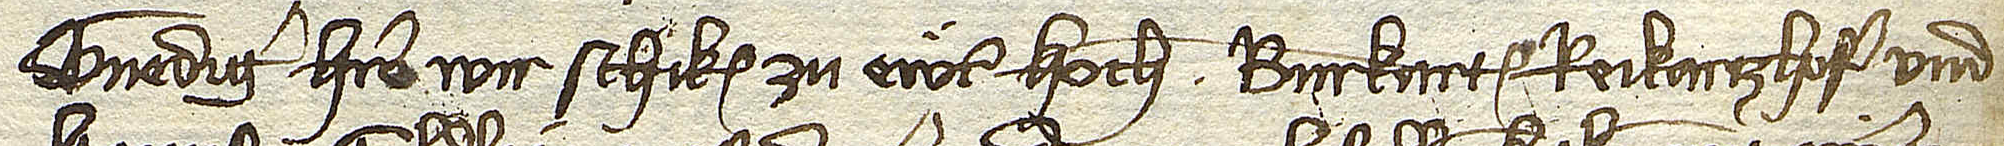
Gnedig* hr*e wir ſchik* ʒu eẅr* hoch* . Burkhart* Reikarcʒhof* vnd
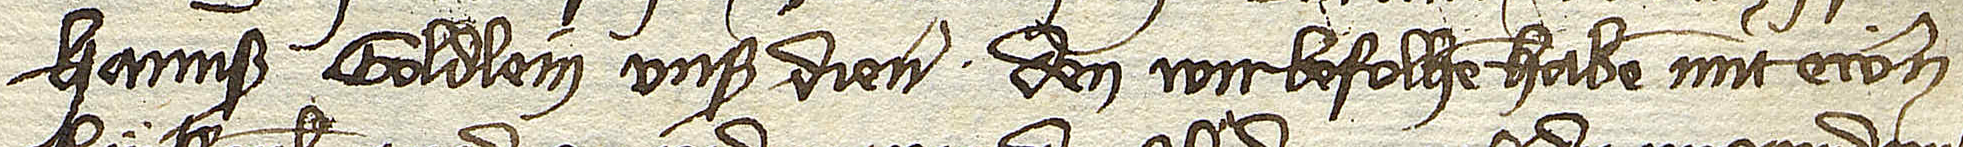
hannſ* Goldlein vnſ* dien* . den wir befolhe* habe* mit eẅ*n
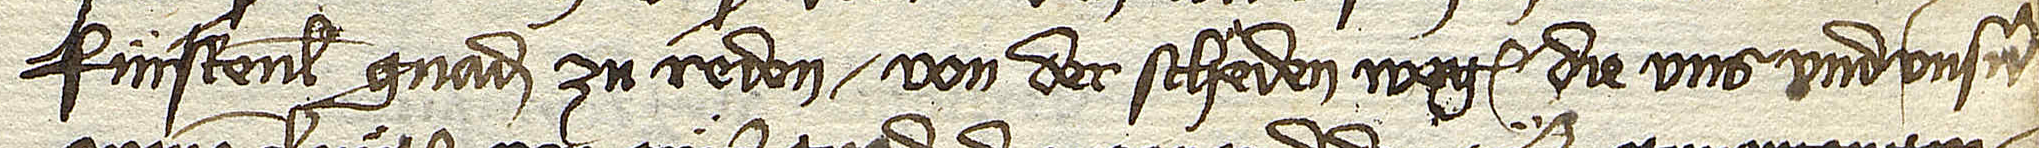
fürſtenl* gnad* ʒu reden / von der ſchëden weg* / die vns vnd vnſn*
